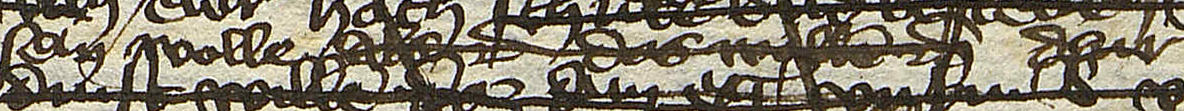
ſein wolle Als ec* das wölle* ec* Aber
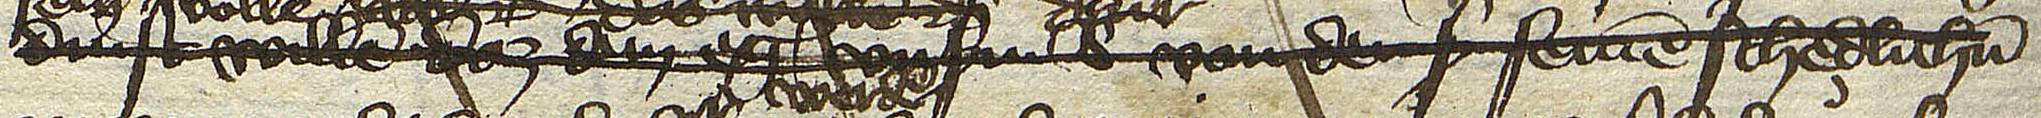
dinſt wille* daʒ dem eg* vnſ*m B* von demſ* ſeine* ſchedlich*n
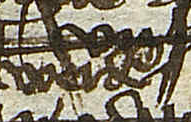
werde*
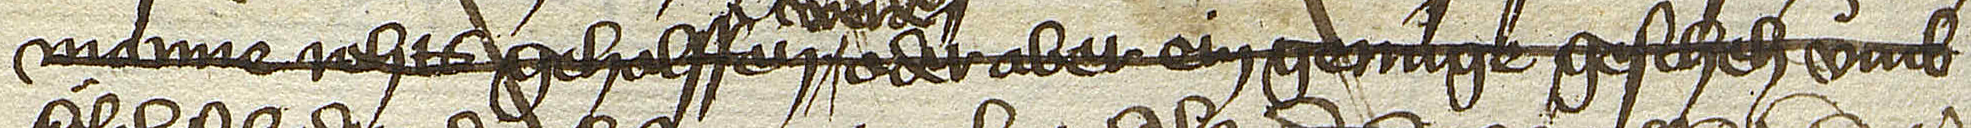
manne rehts geholffen oder aber ein genüge geſcheh v̈mb
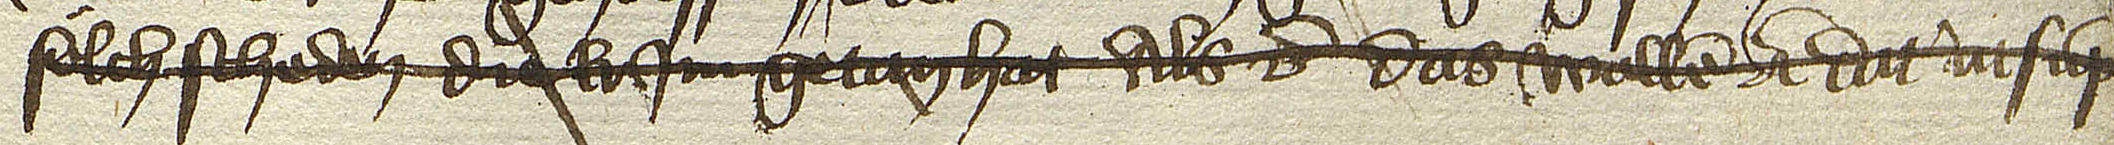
ſölch ſcheden die Er Im getan hat Als ec* das wolle* ec* dat* ut* ſup*
